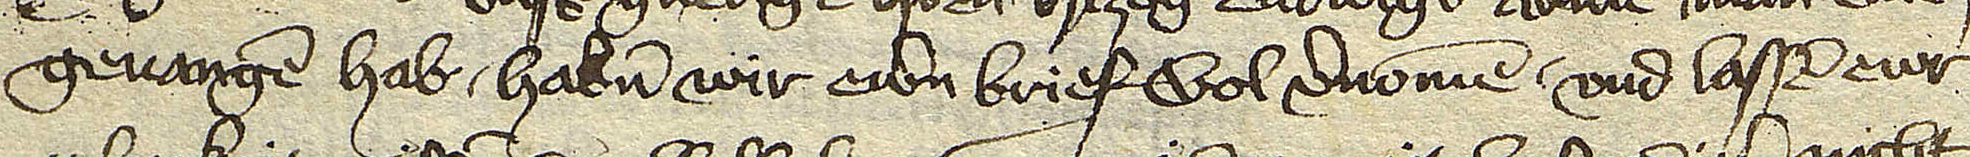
geuange* hab / habn* wir ew*n brief wol v*nome* / vnd laſſe* ewr
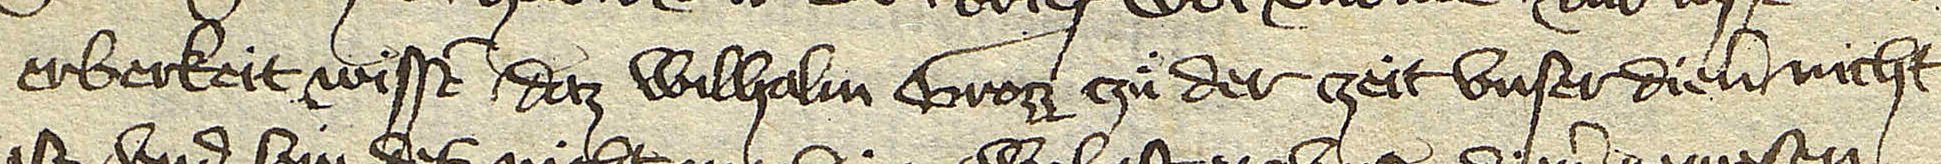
erberkeit wiſſe* / daʒ Wilhalm Groʒʒ cʒü der cʒeit vnſer dien* nicht
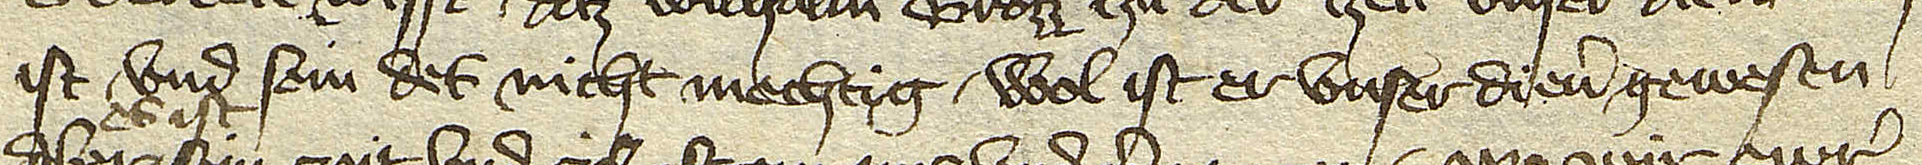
iſt / vnd ſein des nicht mechtig / wol iſt er vnſer dien* geweſen
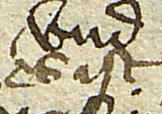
es iſt
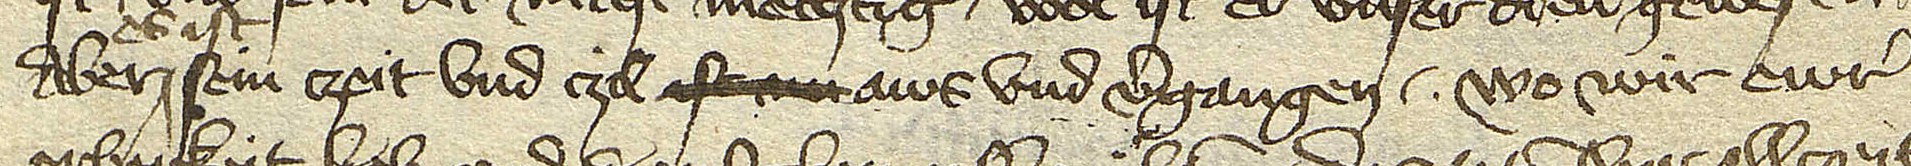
Aber ſein cʒeit vnd cʒil iſt nu aws vnd v*gangen / . wo wir ewr*
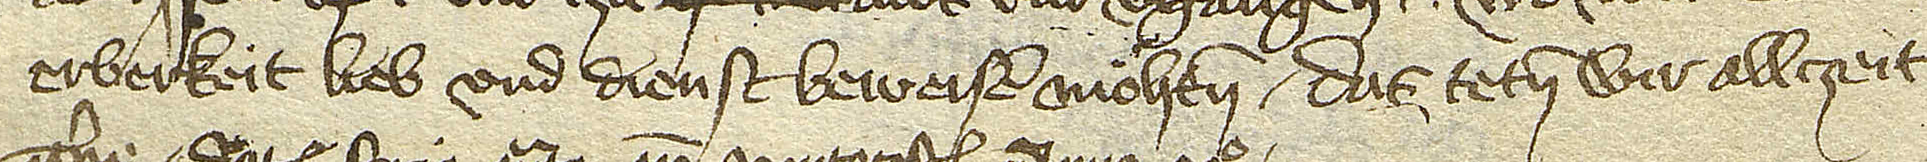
erberkeit lieb vnd dienſt beweiſe* möhtn* / Das tetn* wir allcʒeit
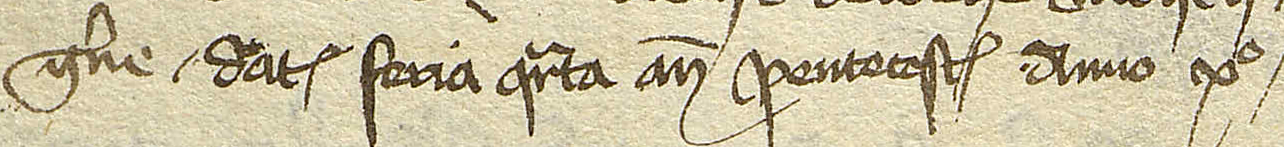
g*ne / dat* feria qrta* an* Pentecoſt* Anno x* /
